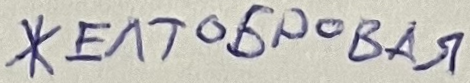желтобровая
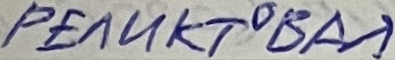реликтовая
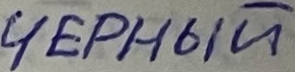черный
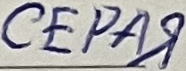серая
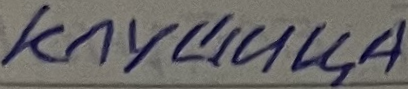клушица
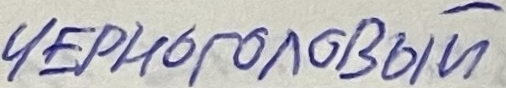черноголовый
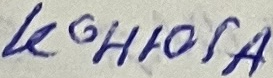конюга
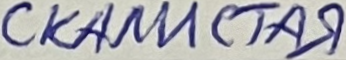скалистая
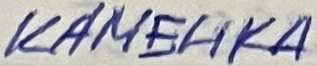каменка
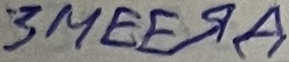змееяд
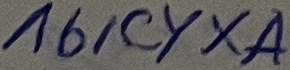лысуха
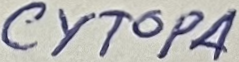сутора
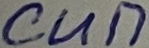сип
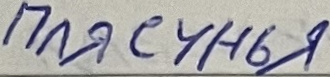плясунья
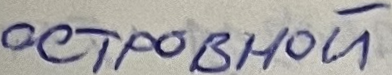островной
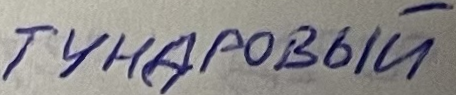тундровый
